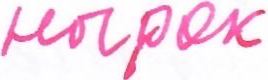нырок
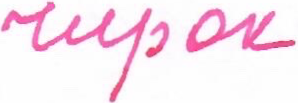чирок
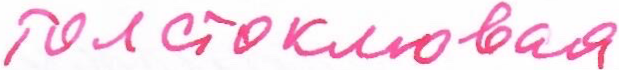толстоклювая
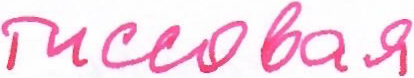тиссовая
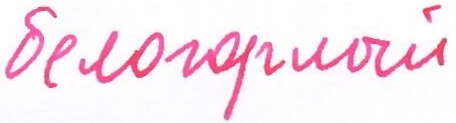белогорлый
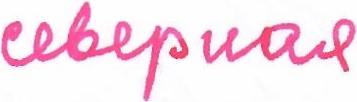северная
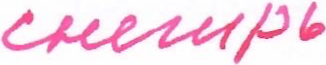снегирь
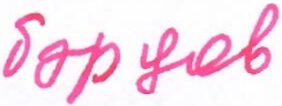бэрдов
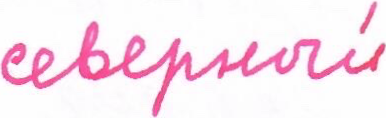северный
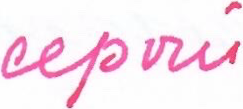серый
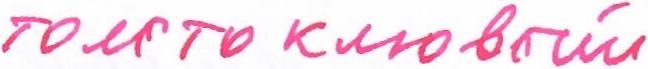толстоклювый
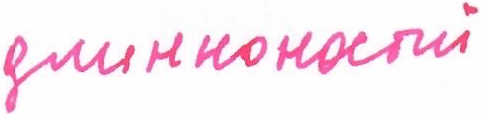длинноносый
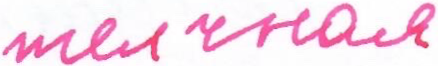желчная
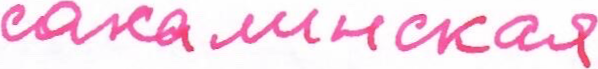сахалинская
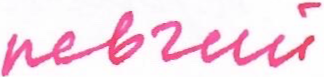певчий
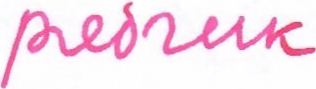рябчик
